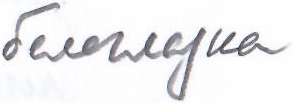белоглазка
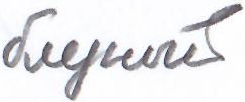бледный
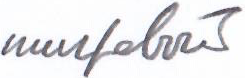тигровый
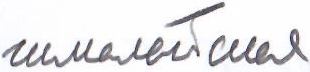гималайская
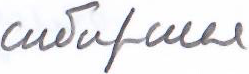сибирская
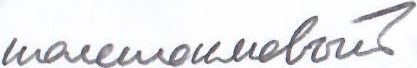толстоклювый
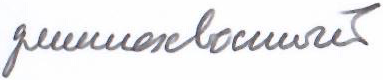длиннохвостый
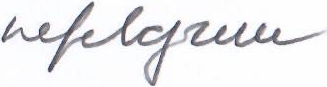перевозчик
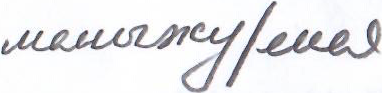маньчжурская
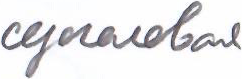седоголовая
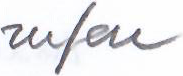чирок
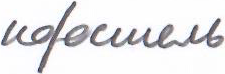коростель
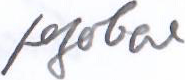розовая
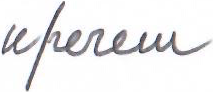кречет
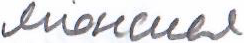японская
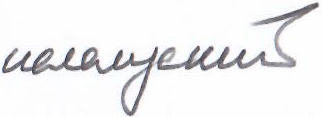исландский
